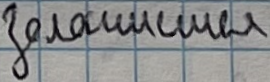золотистая
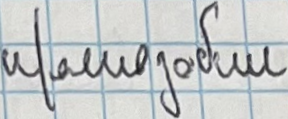краснозобик
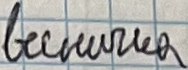весничка
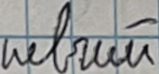певчий
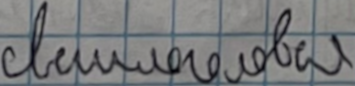светлоголовая
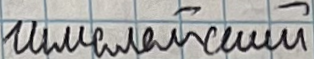гималайский
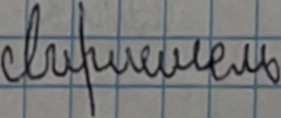свиристель
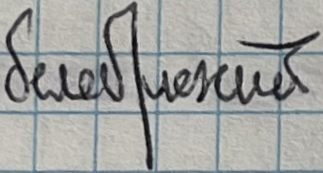белобрюхий
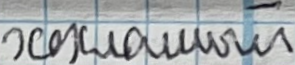хохлатый
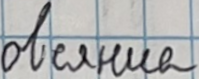овсянка
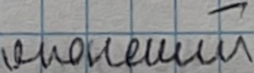японский
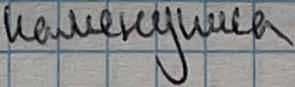каменушка
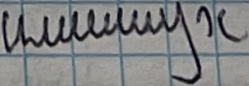клинтух
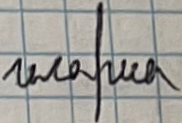гагарка
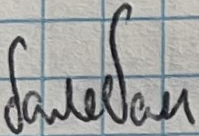балебан
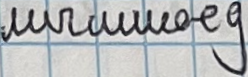личинкоед
